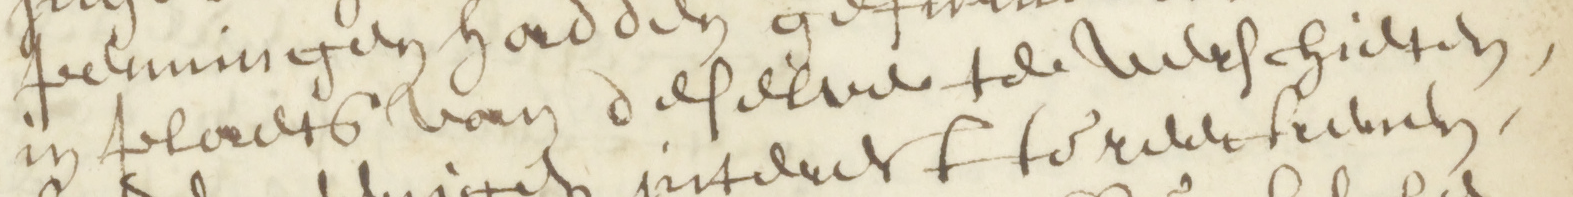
in plaets van deselve te verschieten,
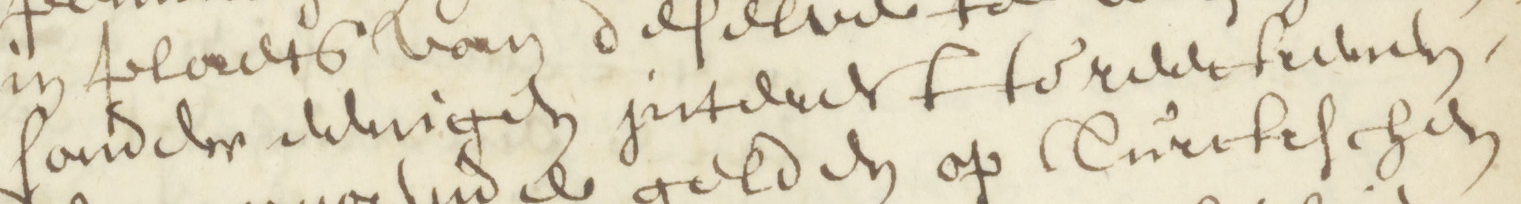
souden eenigen interest te reeckenen
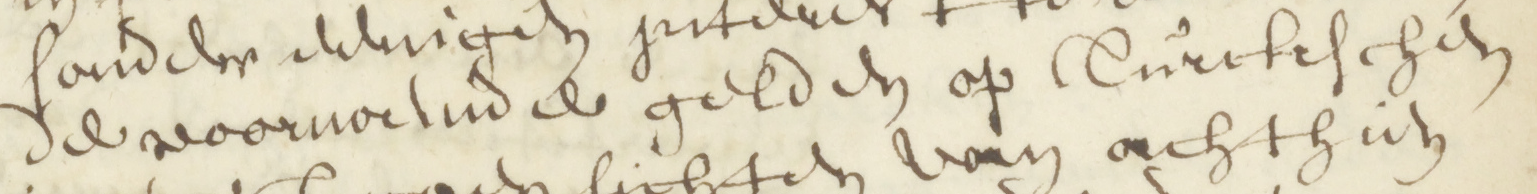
de voornoemde gelden op Turckschen
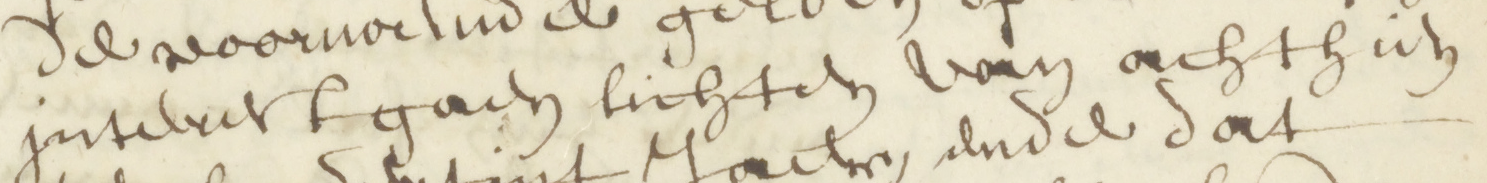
interest gaen lichten van achthien
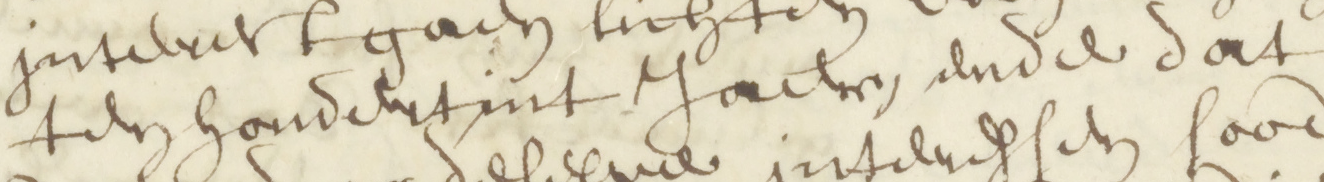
ten hondert int Jaer, ende dat
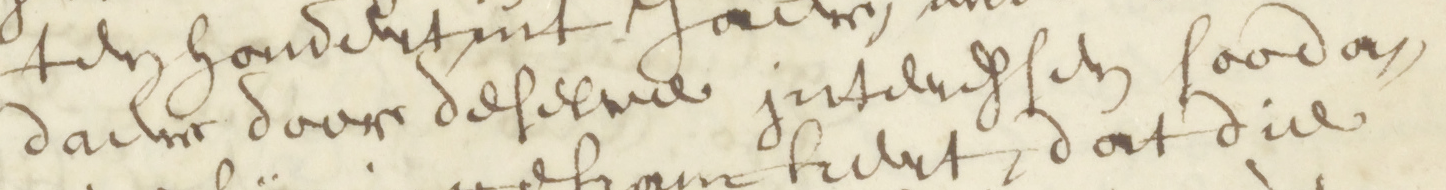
daer door deselve interessen sooda„
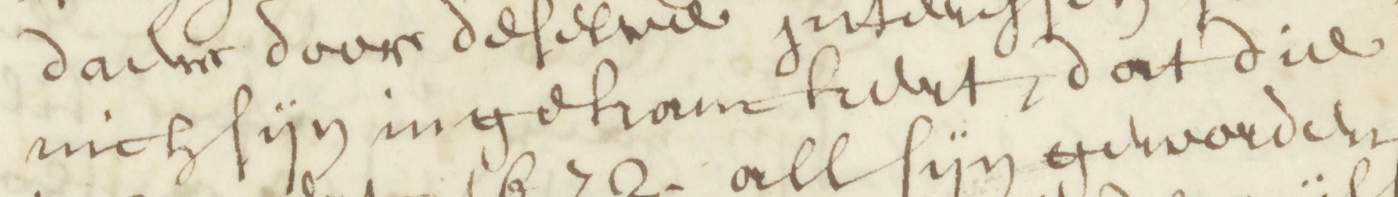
nich sijn ingekanckert, dat die
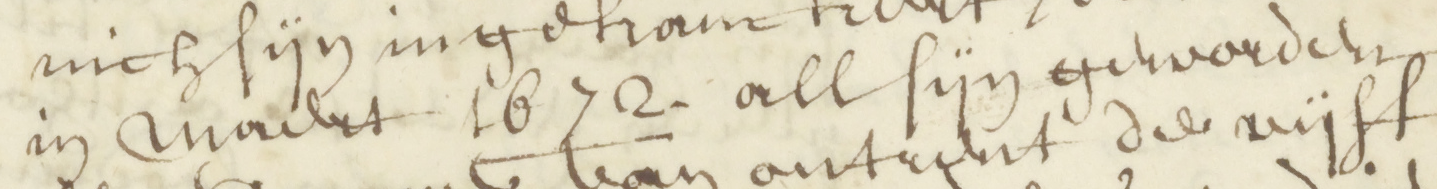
in Maert 1672. all sijn geworden
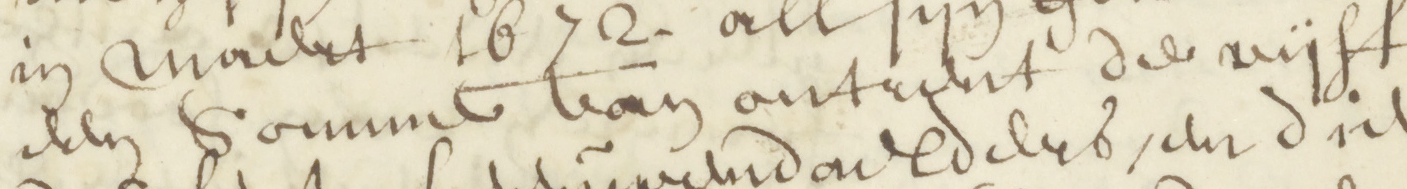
een Somme van ontrent de vijff
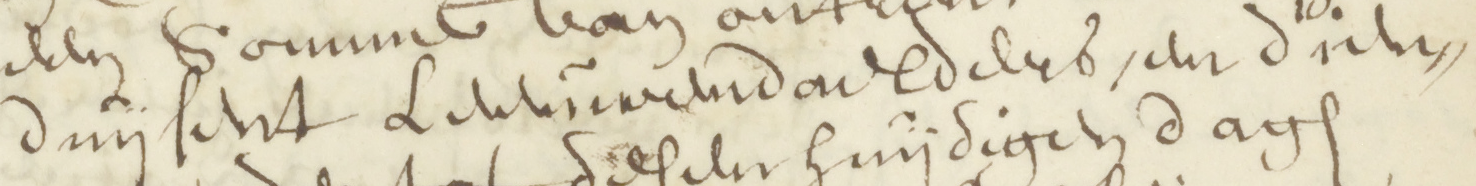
duijsent Leeuwendaelders, en dien„
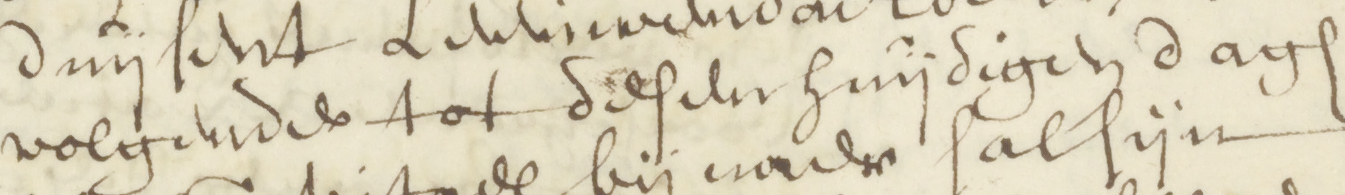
volgende tot desen huijdigen dagh
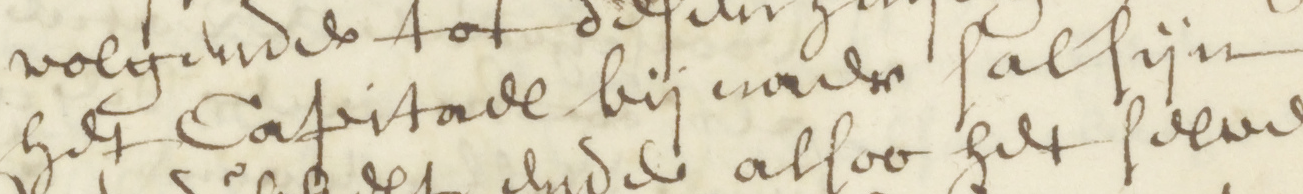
het Capitael bij naer sal sijn
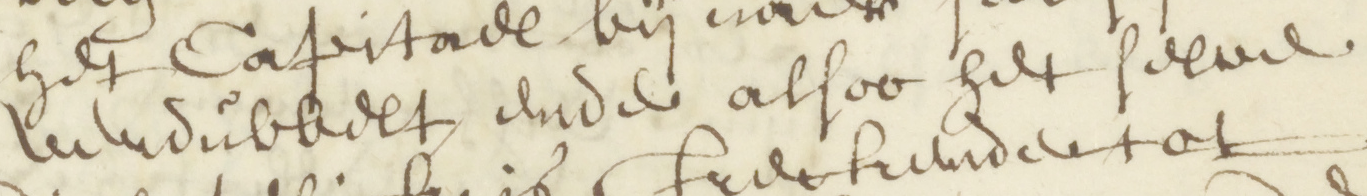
verdubbelt, ende alsoo het selve
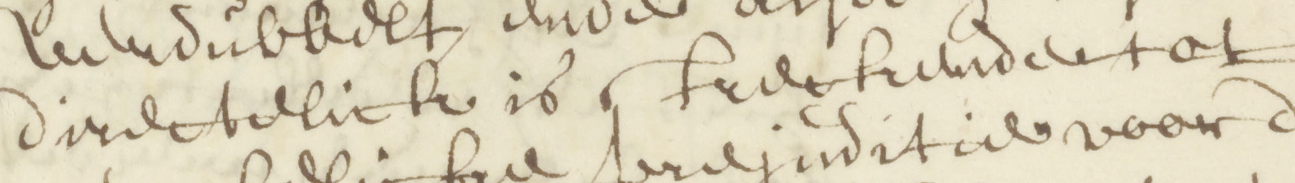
directelick is streckende tot
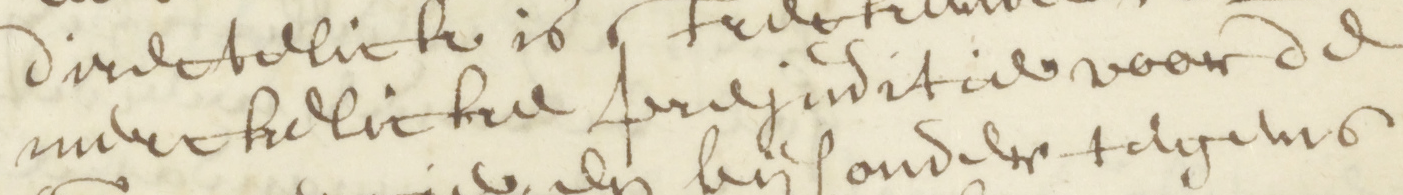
merckelicke prejuditie voor de
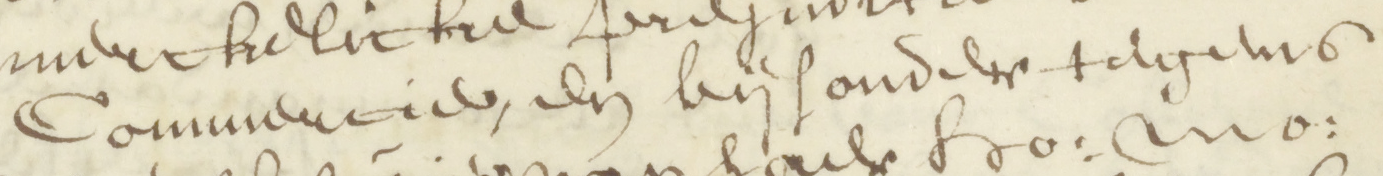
Commercie, en bijsonder tegens
